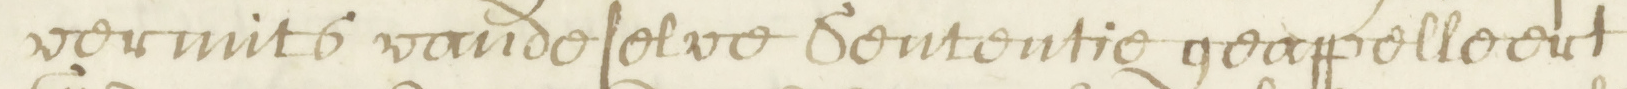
vermits vandeselve Sententie geappelleert
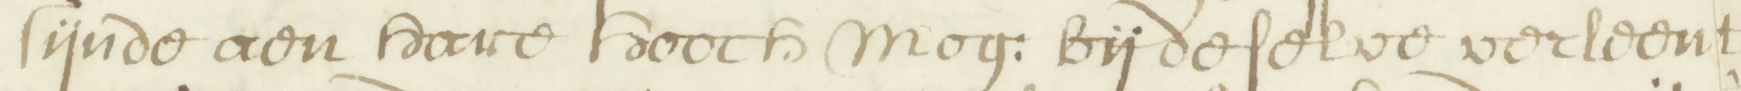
sijnde aen hare hooch Mog: bij deselve verleent,
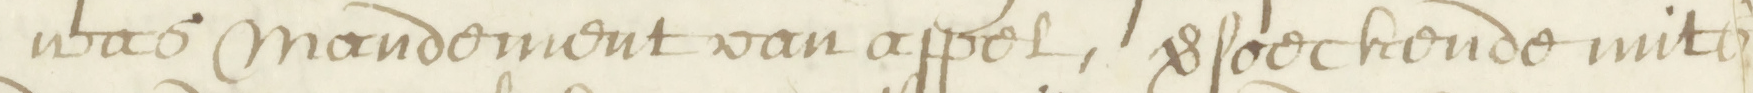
was Mandement van appel, vsoeckende mits
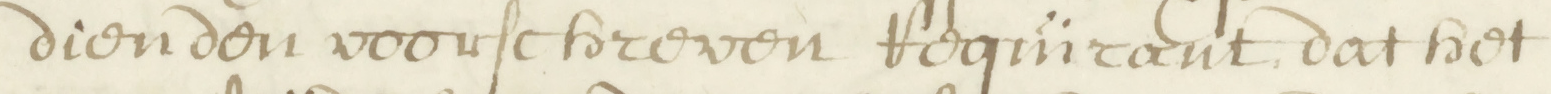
dien den voorschreven Requirant, dat het
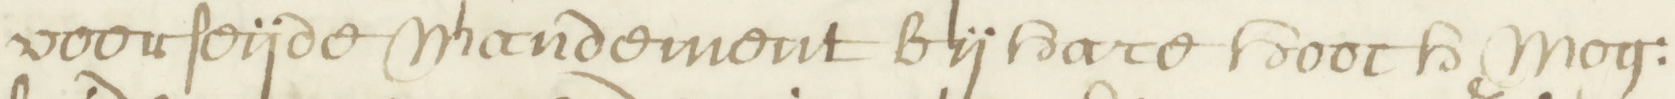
voorseijde Mandement bij hare Hooch Mog:
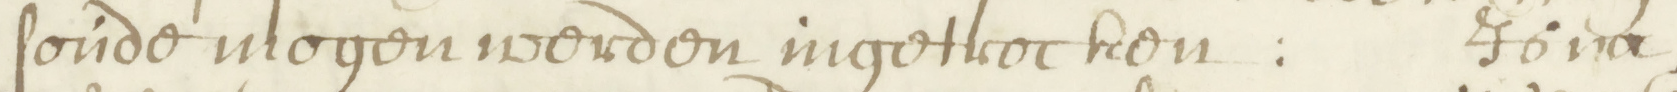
soude mogen werden ingetrocken: Is na
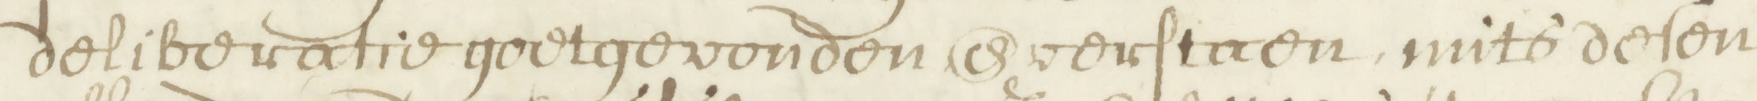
deliberatie goetgevonden, & verstaen, mits desen
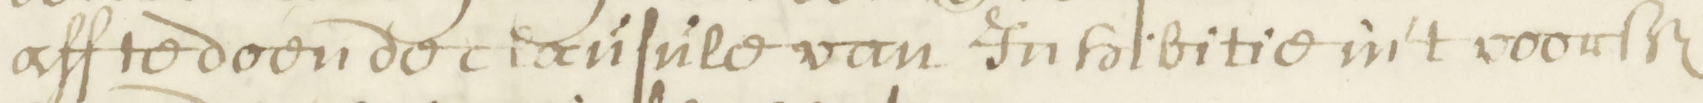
aff te doen de clausule van Inhibitie in't voors
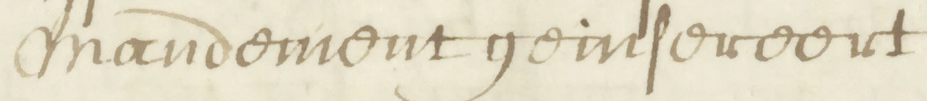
Mandement geinsereert.
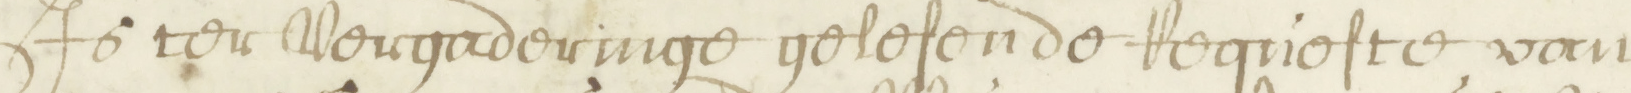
Is ter Vergaderinge gelesen de Requeste van
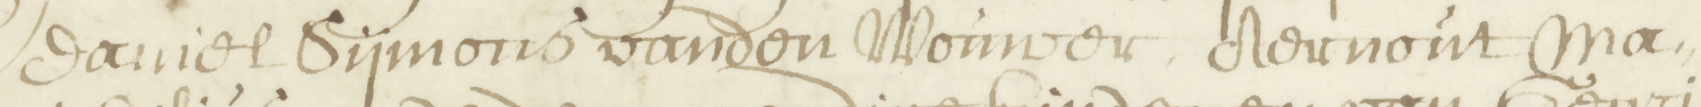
Daniel Sijmons vanden Wouwer, Aernout Ma„
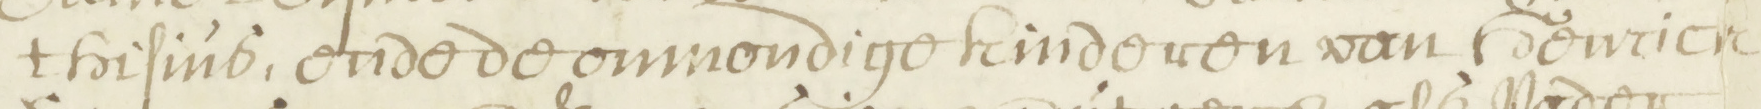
thisius, ende de onmondige kinderen van Henrick
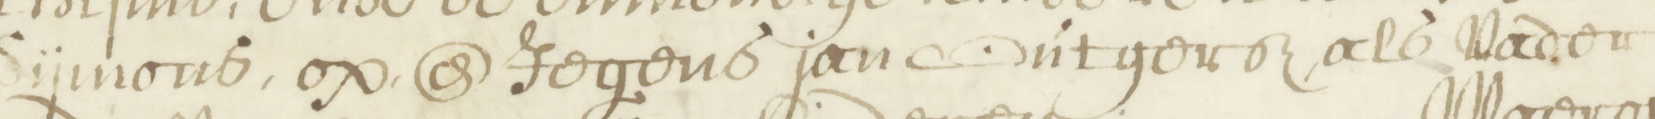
Sijmons, op & Jegens jan Outgersz als Vader
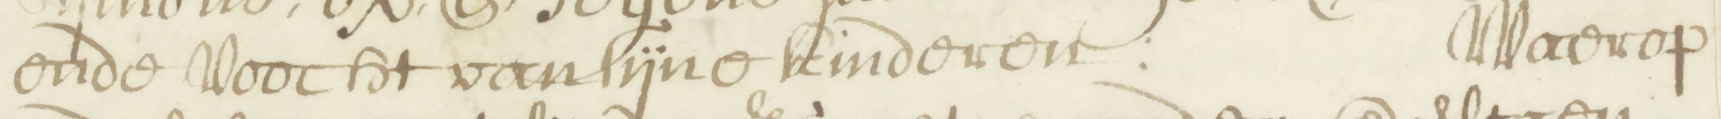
ende Voocht van sijne kinderen: Waerop
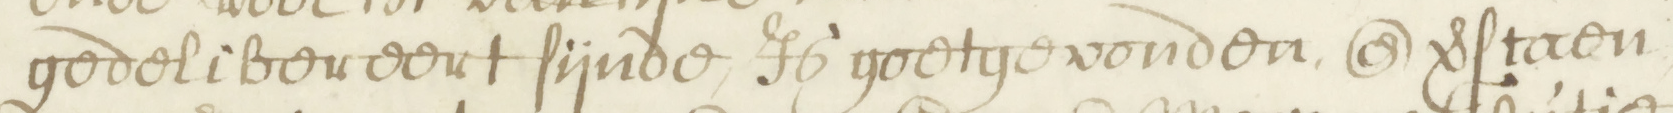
gedelibereert sijnde, Is goetgevonden & vstaen
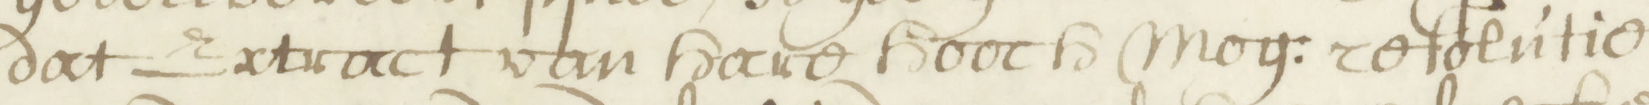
dat Extract van hare Hooch Mog: resolutie
